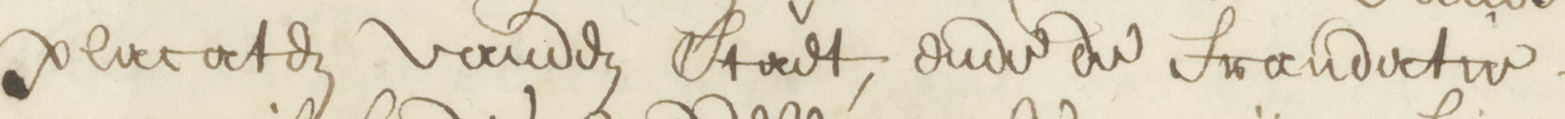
placaten vanden Staet, ende de fraudatie
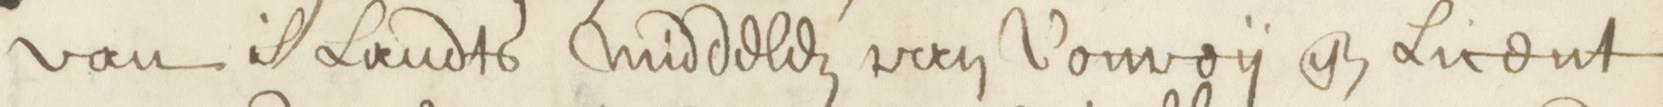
van ‛s Landts middelen van Convoij & Licent
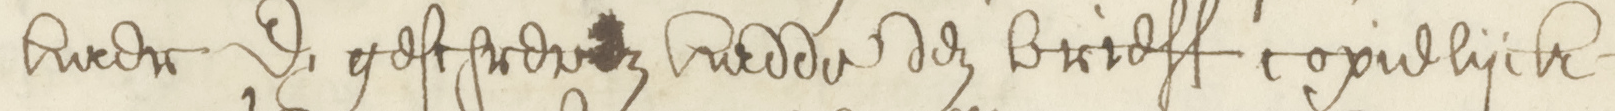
haer E. geschreven hadde den brieff copielijck
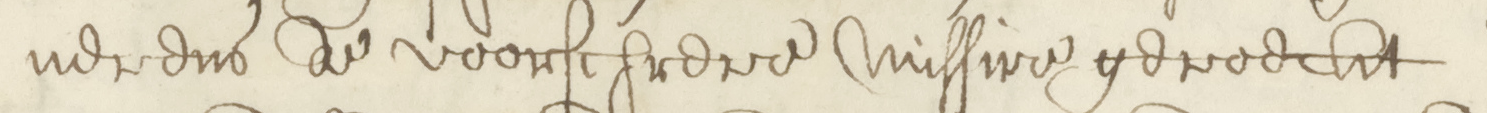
nevens de voorschreve missive gevoecht
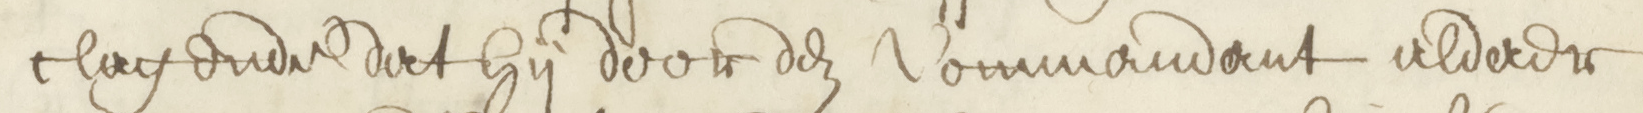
clagende dat hij door den Commandant aldaer,
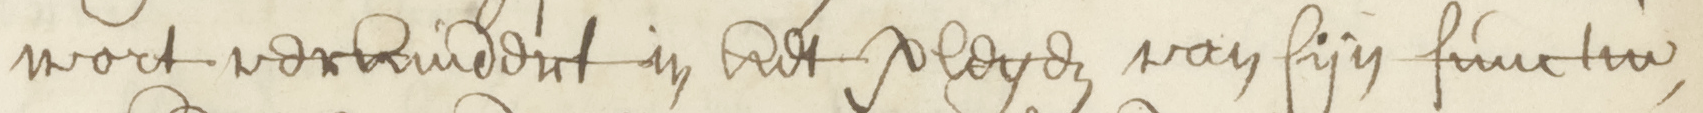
wort verhindert in het plegen van sijn functie,
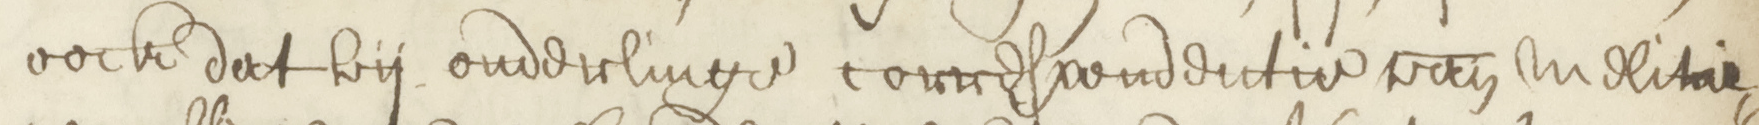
oock dat bij onderlinge correspondentie van melitai„
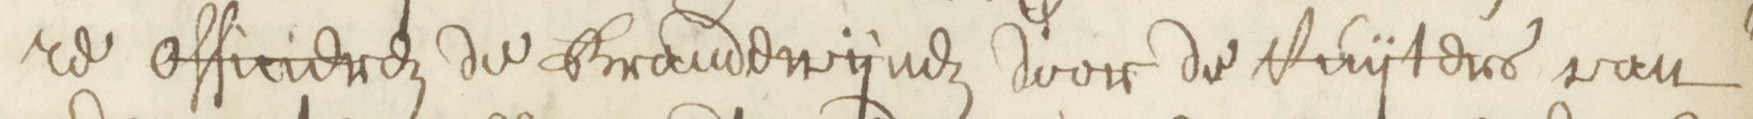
re officieren de Brandewijnen door de Ruijters van
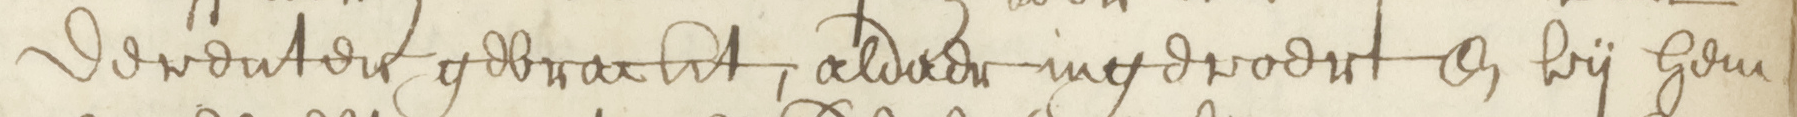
Deventer gebracht, aldaer ingevoert & bij hem
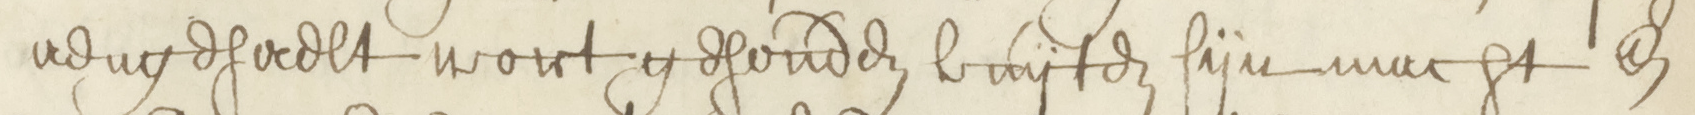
aengehaelt wort gesonden buijten sijn macht &
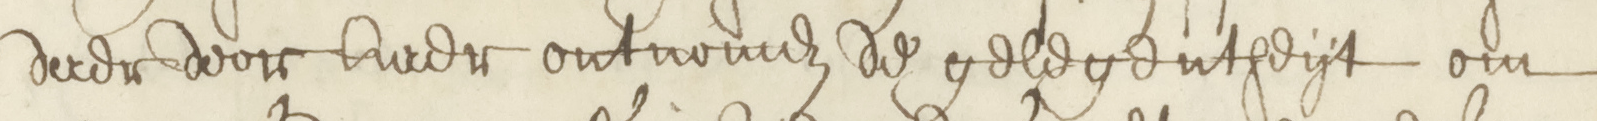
daer door haer ontnomen de gelegentheijt om
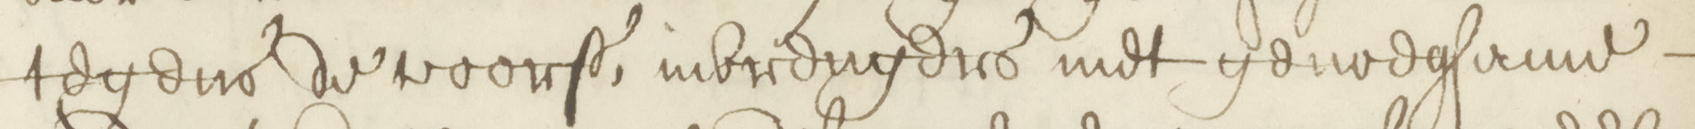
tegens de voors. inbrengers met genoegsame
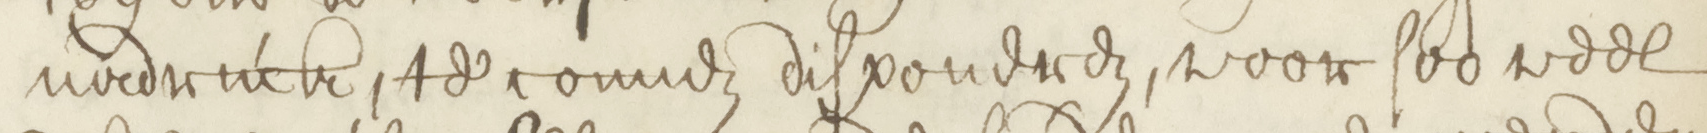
nadruck, te connen disponeren, voor soo veel
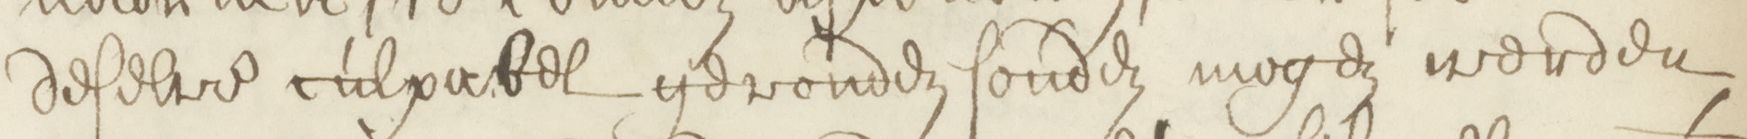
deselve culpabel gevonden souden mogen werden,
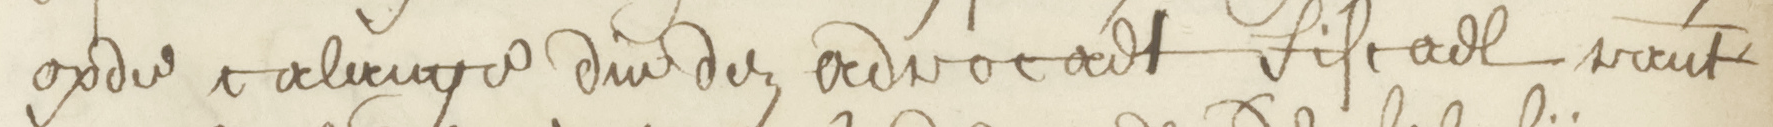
opde calange die den Advocaet fiscael vant
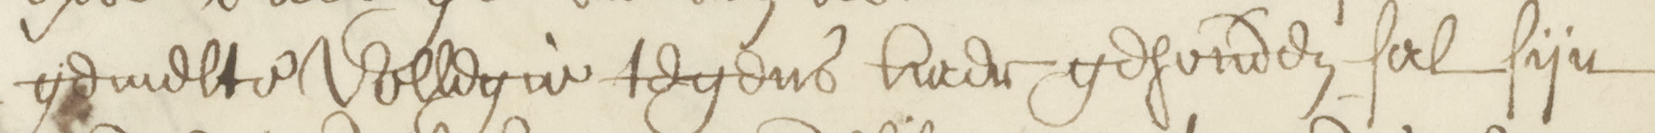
gemelte Collegie tegens haer gehouden sal sijn
